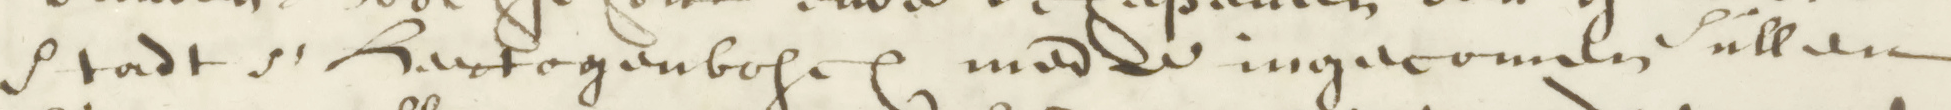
stadt s‛Hertogenbosch mede ingecomen sullen
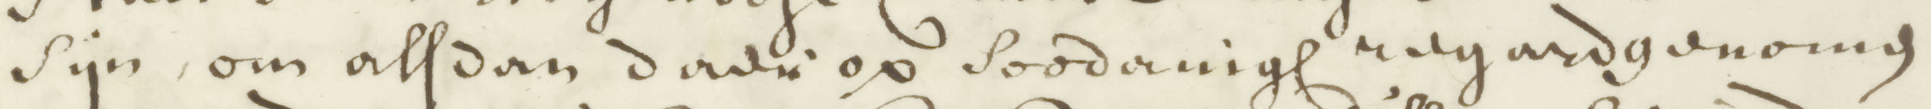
sijn, om alsdan daer op soodanigh regard genomen
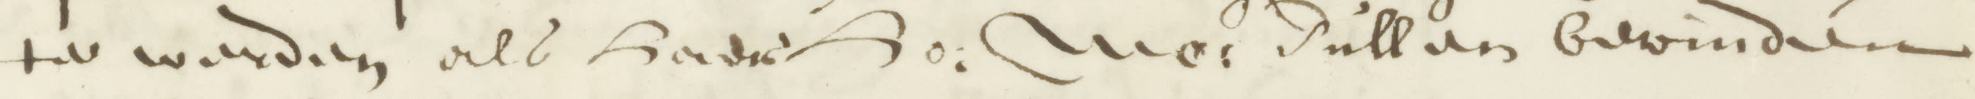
te werden als haer Ho:Mo: sullen bevinden
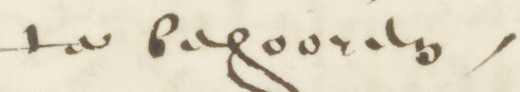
te behooren.
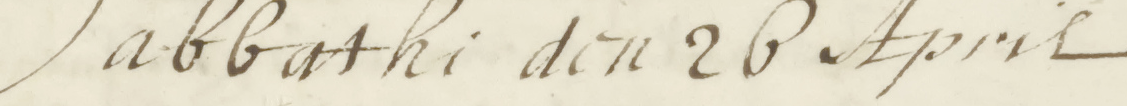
Sabbathi den 26. April
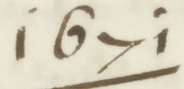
1671
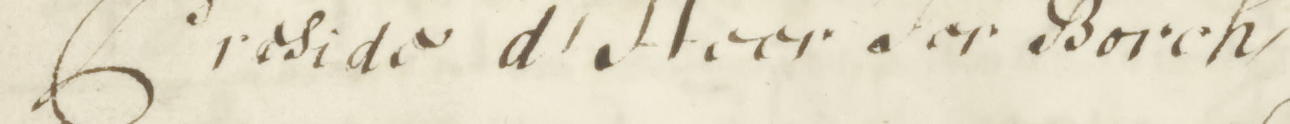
Preside d‛ Heer Ter Borch,
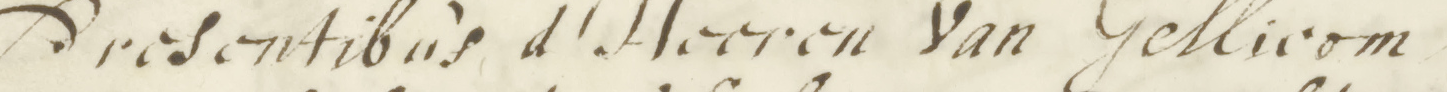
Presentibus d'Heeren van Gellicom
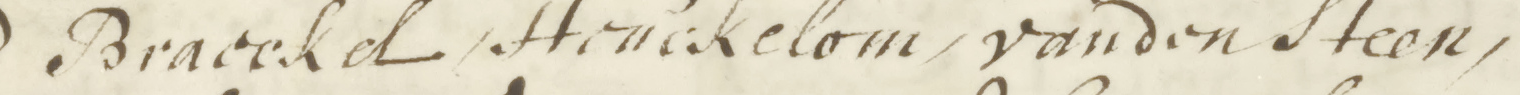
Braeckel, Heuckelom, vanden Steen,
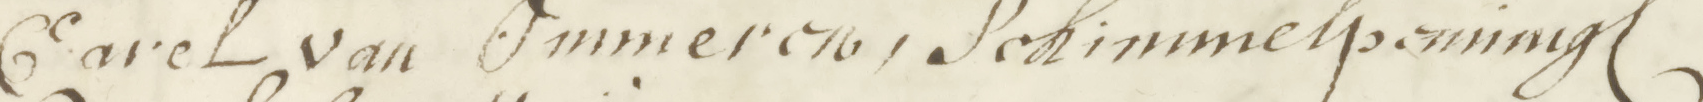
Carel van Ommeren, Schimmelpenningh
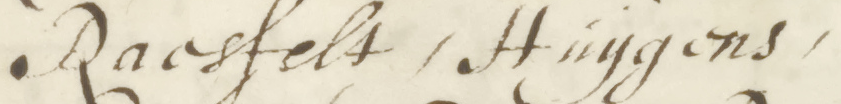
Raesfelt, Huijgens,
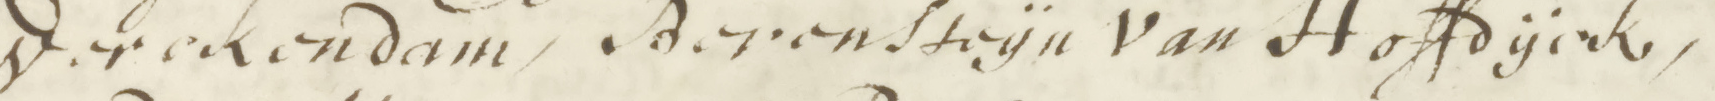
Werckendam, Berensteijn van Hoffdijck,
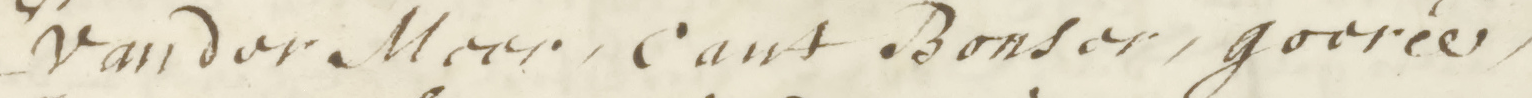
Van der Meer, Cant Bonser, goeree,
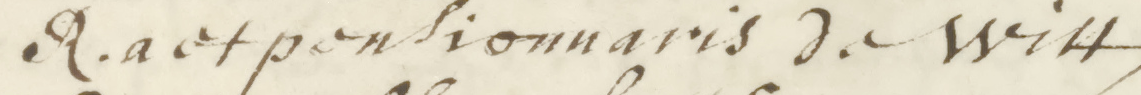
Raetpensionnaris de Witt
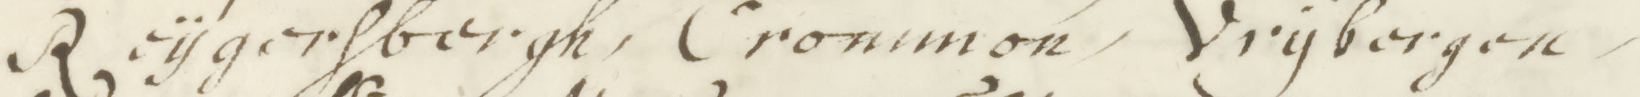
Reijgersbergh, Crommon, Vrijbergen,
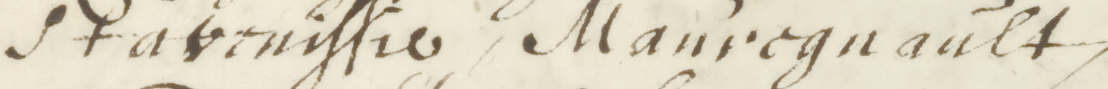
Stavenissie, Maurequault
